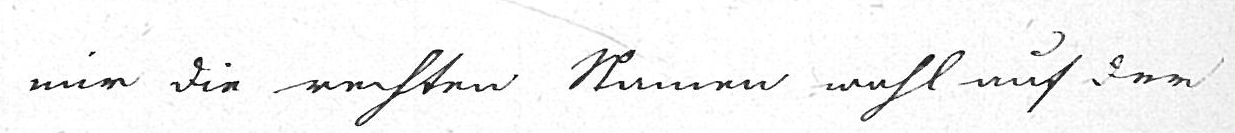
mir die rechten Namen wohl auf der
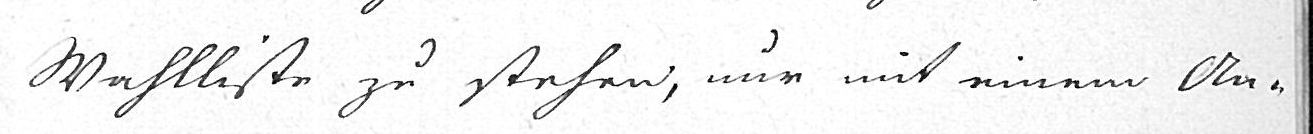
Wahlliste zu stehen, nur mit einem An-
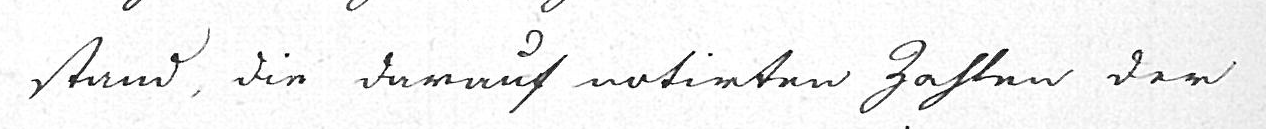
stand, die darauf notirten Zahlen der
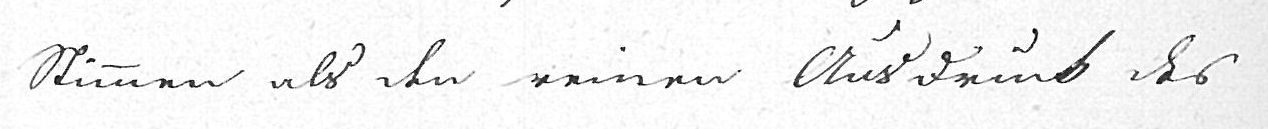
Stimmen als den reinen Ausdruck des
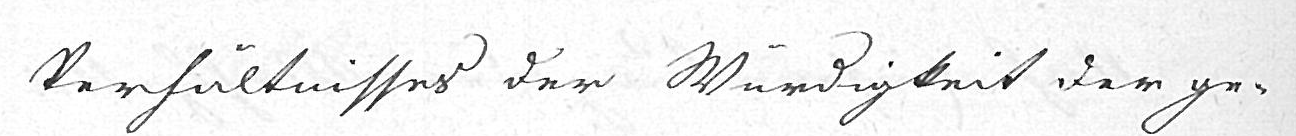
Verhältnisses der Würdigkeit der ge-
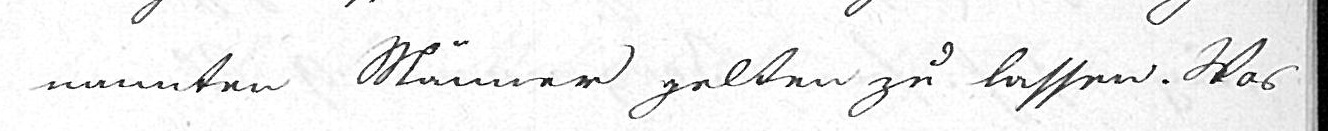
nannten Männer gelten zu lassen. Was
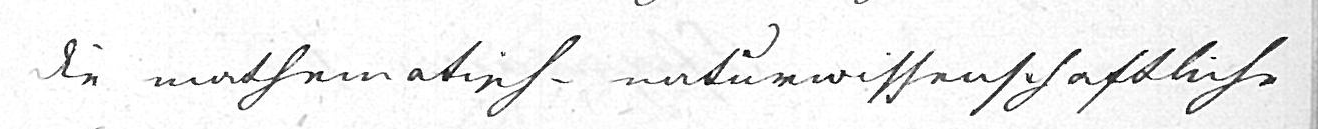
die mathematisch-naturwissenschaftliche
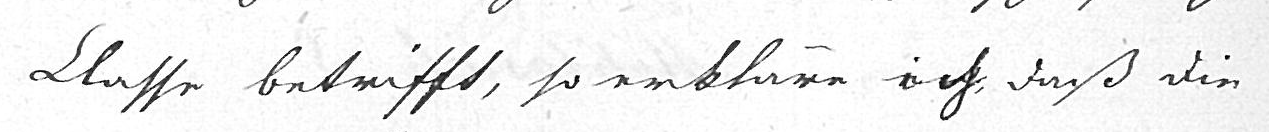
Classe betrifft, so erkläre ich, daß die
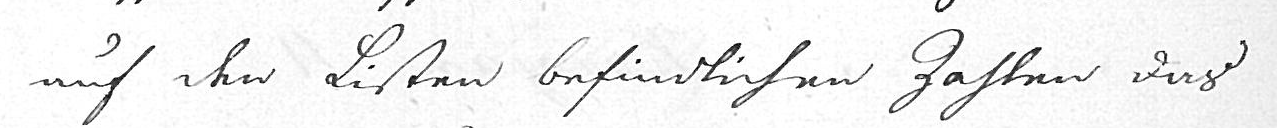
auf den Listen befindlichen Zahlen das
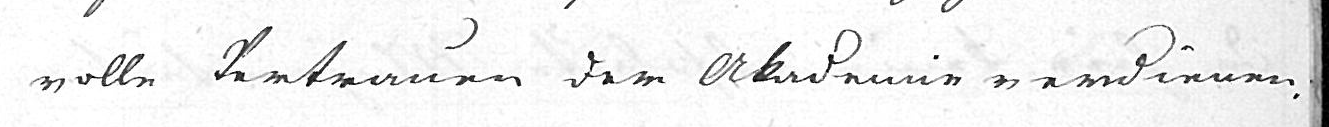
volle Vertrauen der Akademie verdienen.
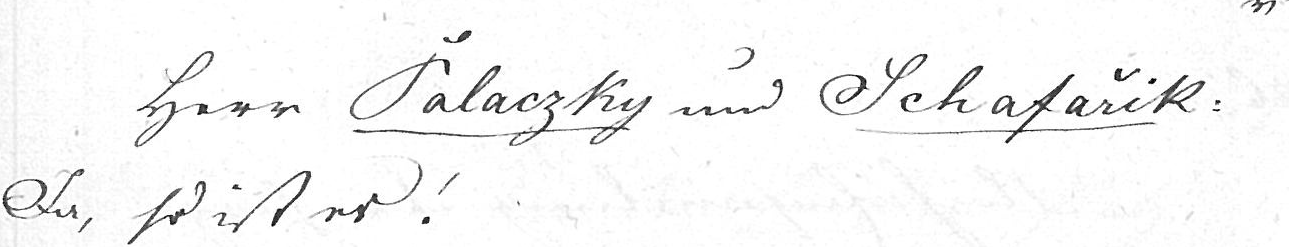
Herr Palaczky und Schafarik:
